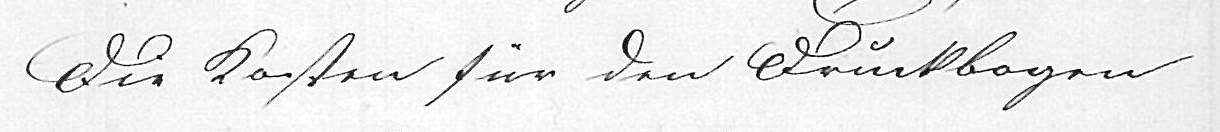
Der Kosten für den Druckbogen
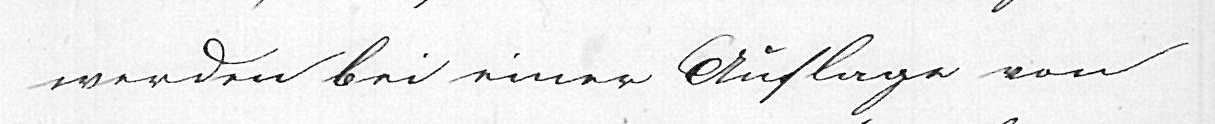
werden bei einer Auflage von
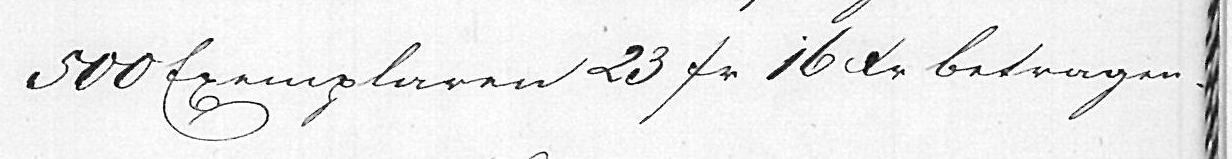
500 Exemplaren 23 fr 16 kr betragen.
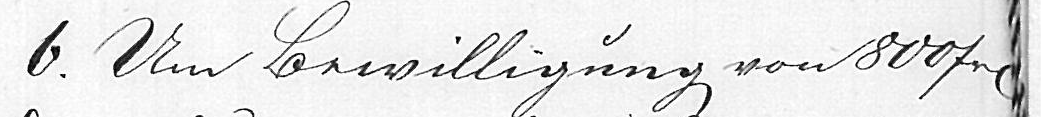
b. Um Bewilligung von 800 fr
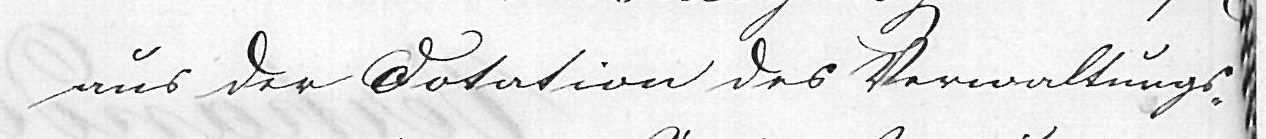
aus der Dotation des Verwaltungs-
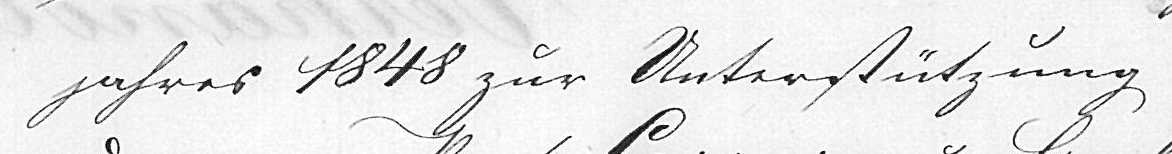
jahres 1848 zur Unterstützung.
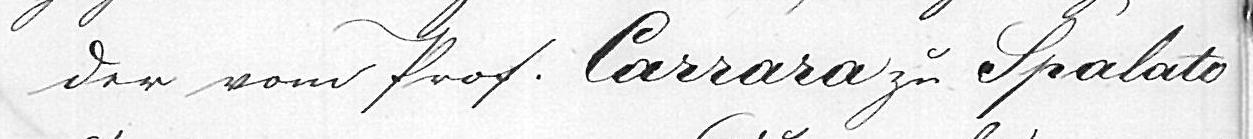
der vom Prof. Carrara zu Spalato
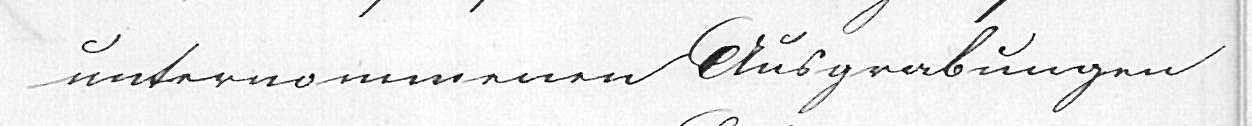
unternommenen Ausgrabungen
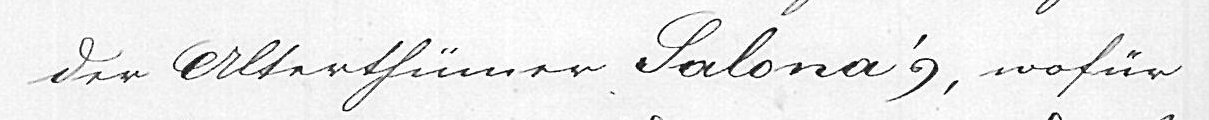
der Alterthümer Salona's, wofür
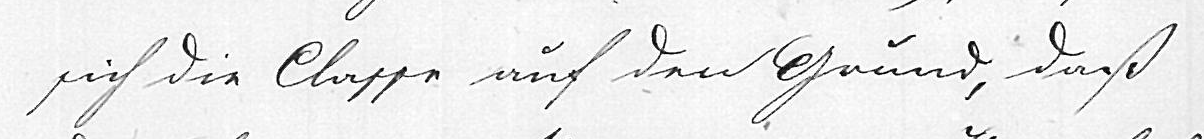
sich die Classe auf den Grund, daß
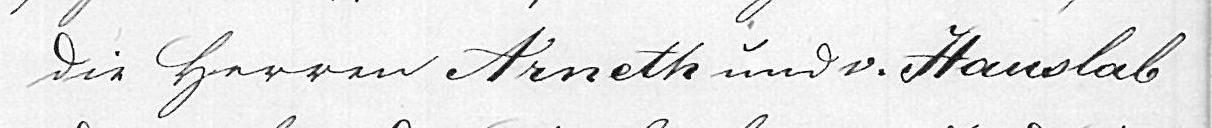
die Herren Arneth und v. Hauslab
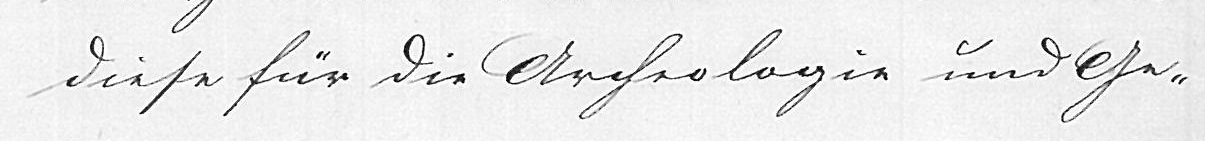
diese für die Archeologie und Ge-
